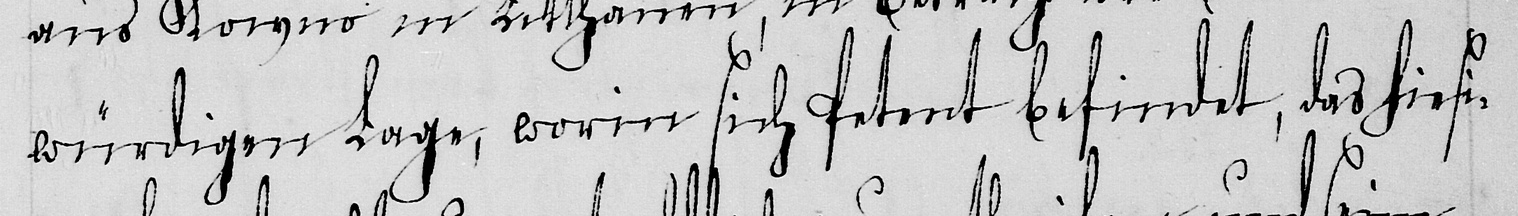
würdigen Lage, worin sich Petent befindet, das hiesi¬
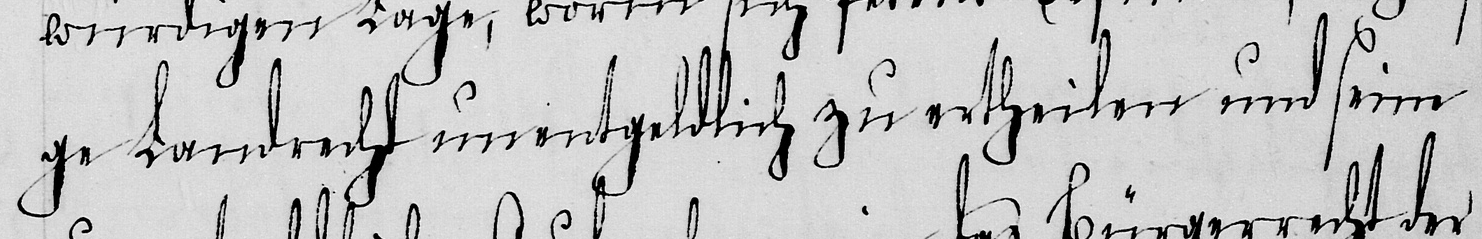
ge Landrecht unentgeldlich zu ertheilen und seine
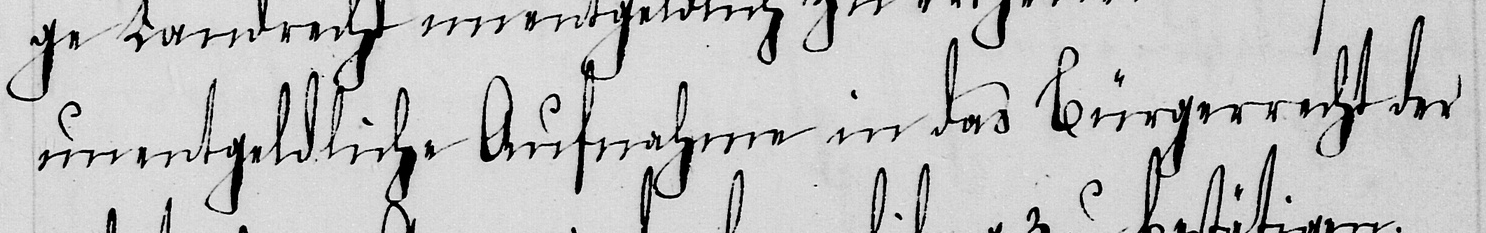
unentgeldliche Aufnahme in das Bürgerrecht der
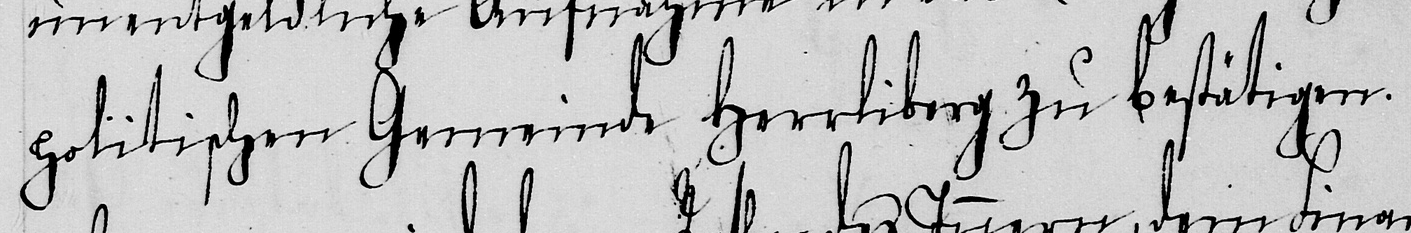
politischen Gemeinde Herrliberg zu bestätigen.
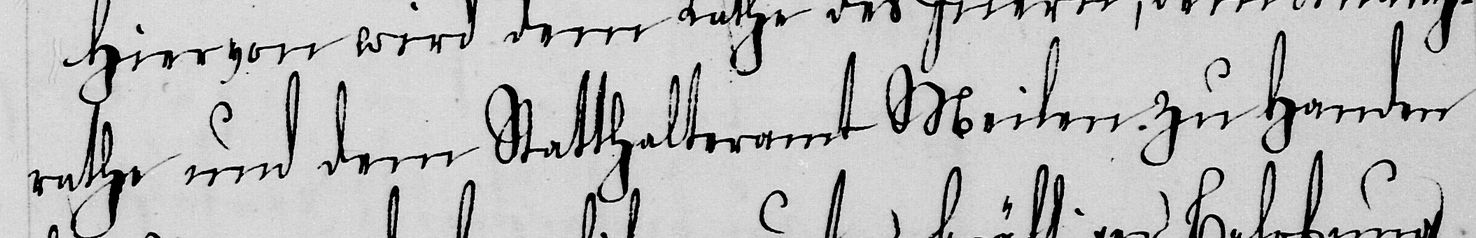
rathe und dem Statthalteramt Meilen zu Handen
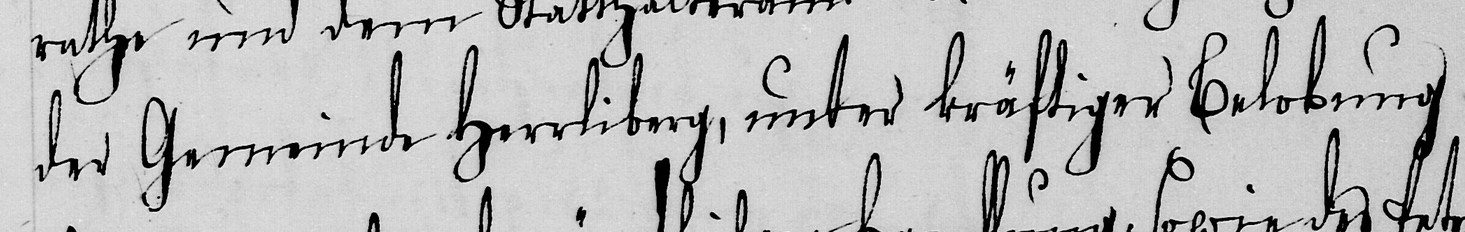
der Gemeinde Herrliberg, unter kräftiger Belobung
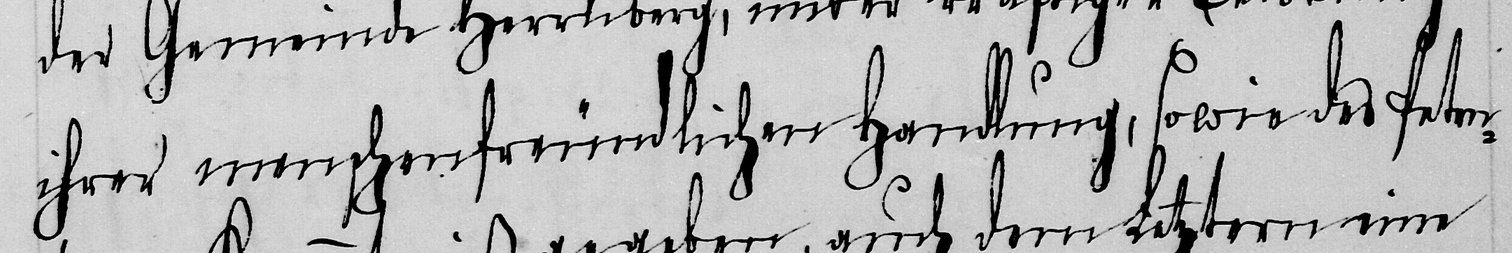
ihrer menschenfreundlichen Handlung, sowie des Pete¬
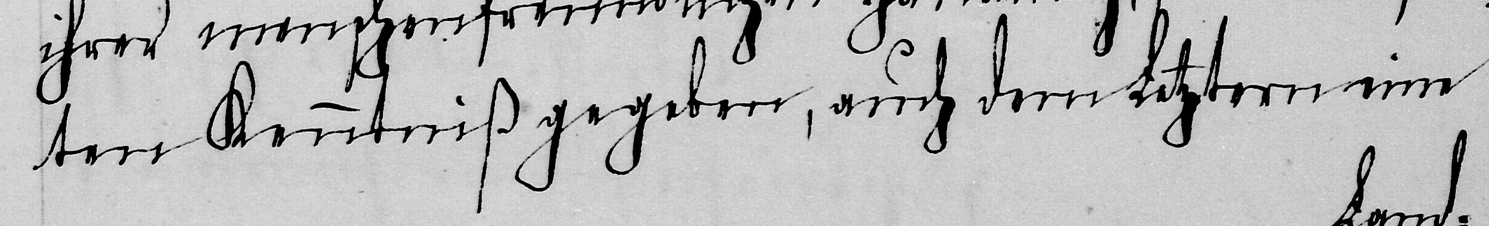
nten Kenntniß gegeben, auch dem Letztern eine
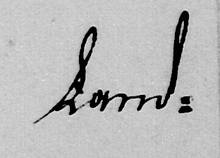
län¬
